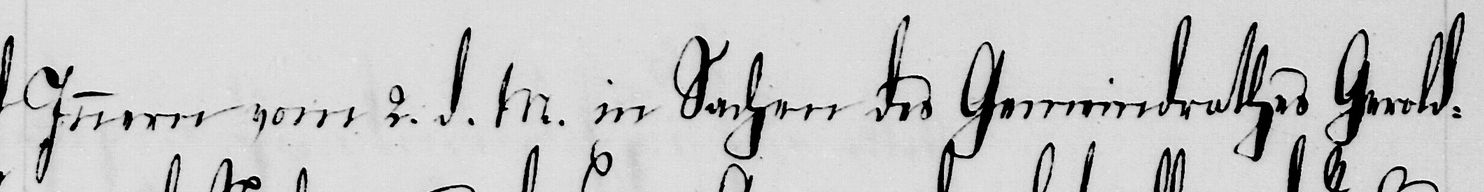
Innern vom 2. d. M. in Sachen des Gemeindrathes Gerold¬
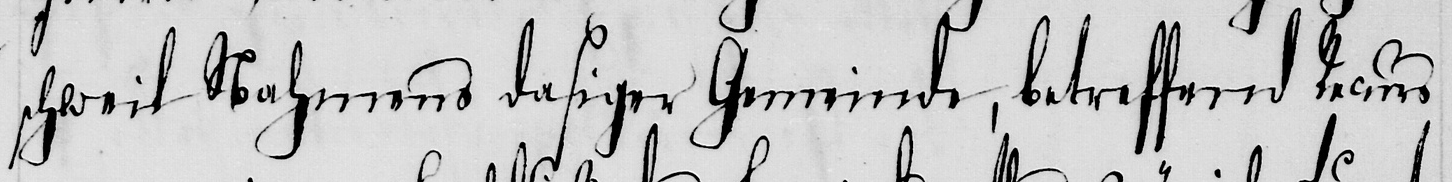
schweil Nahmens dasiger Gemeinde, betreffend Recurs
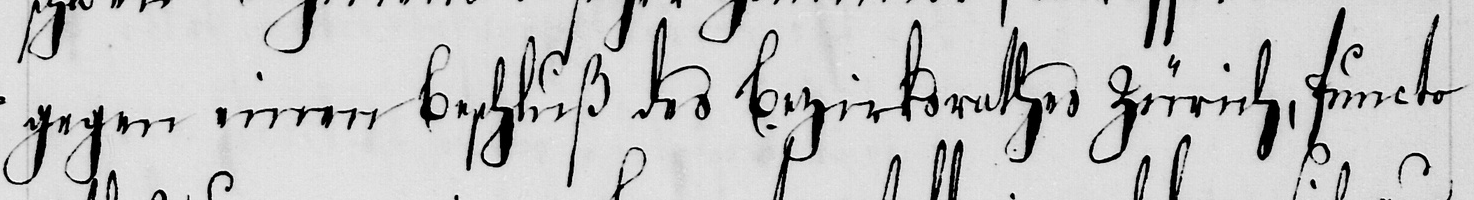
gegen einen Beschluß des Bezirksrathes Zürich, Puncto
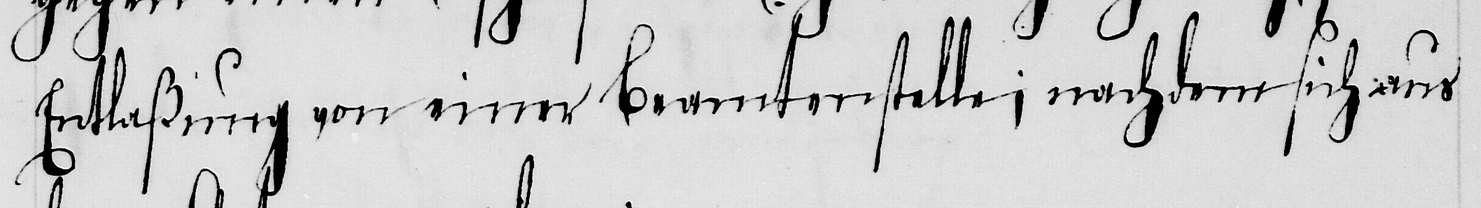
Entlaßung von einer Beamtenstelle; nachdem sich aus
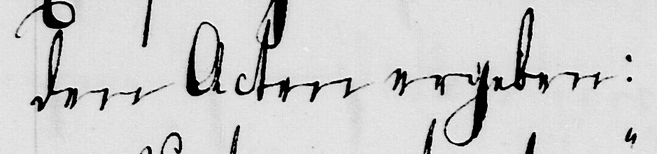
den Acten ergeben:
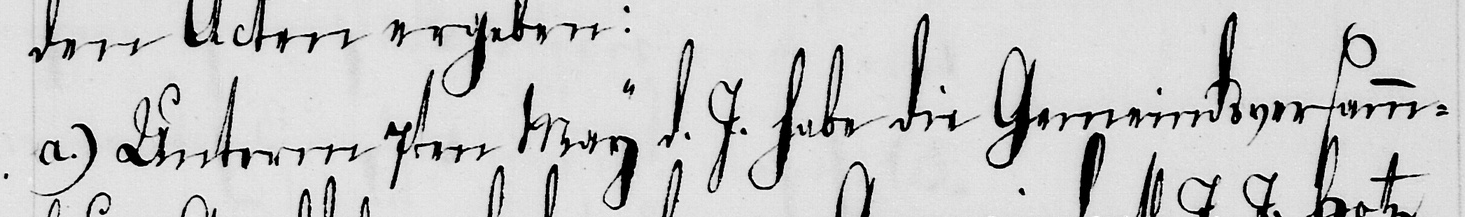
a.) Unterm 7ten May d. J. habe die Gemeindsversamm¬
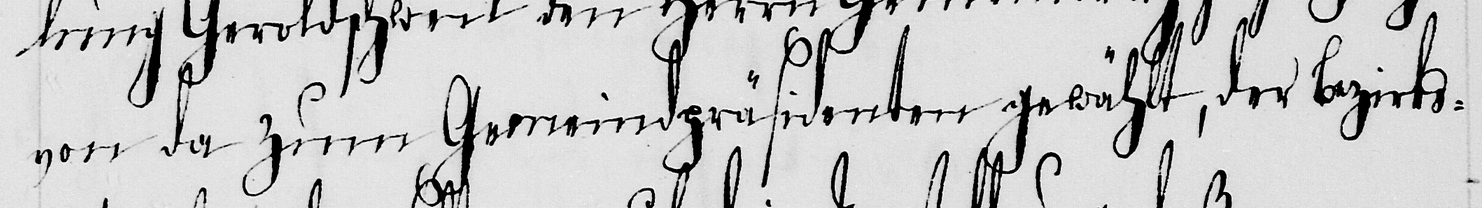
von da zum Gemeindpräsidenten gewählt, der Bezirksr¬
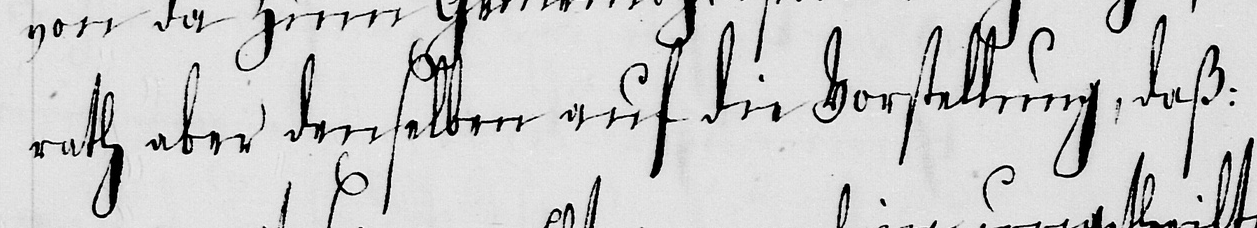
ath aber denselben auf die Vorstellung, daß:
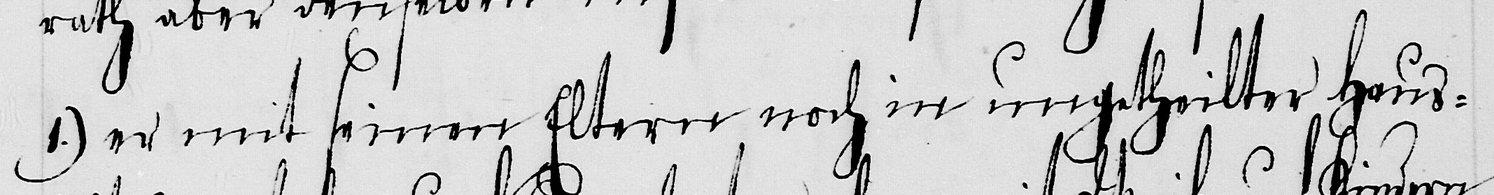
1.) er mit seinen Eltern noch in ungetheilter Haus¬
